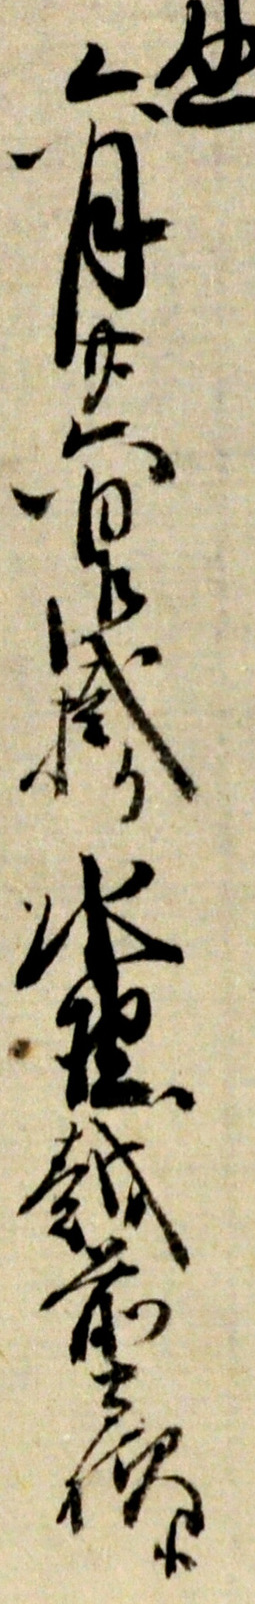六月廿六日御掛り水野越前守様江
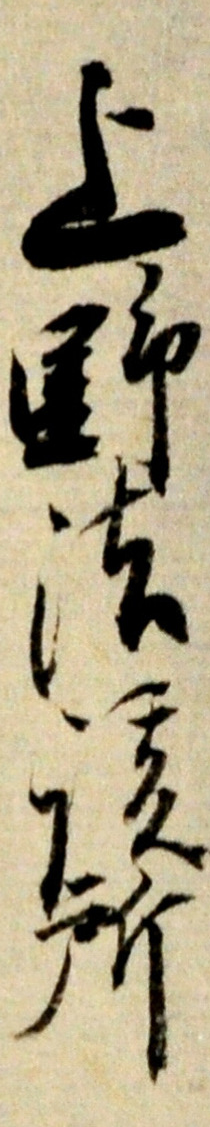上野法護所
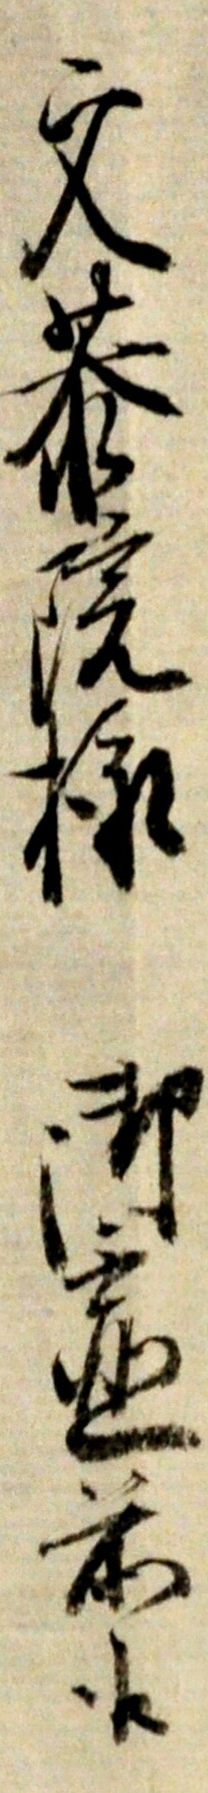文恭院様御霊前江
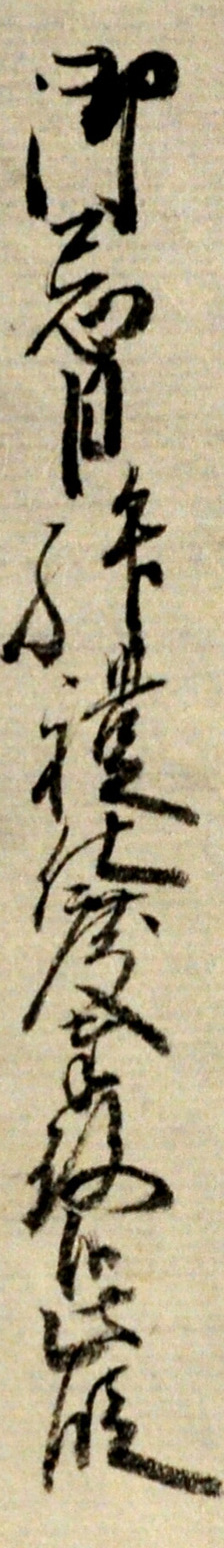御忌日拝礼仕度奉致候、此段
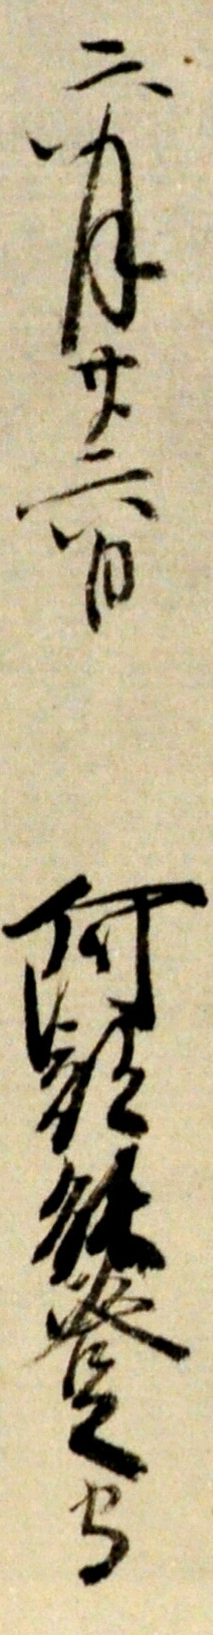六月廿六日阿部能登守
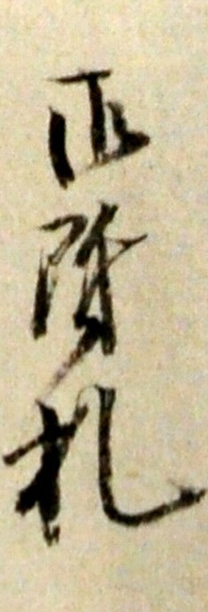御附札
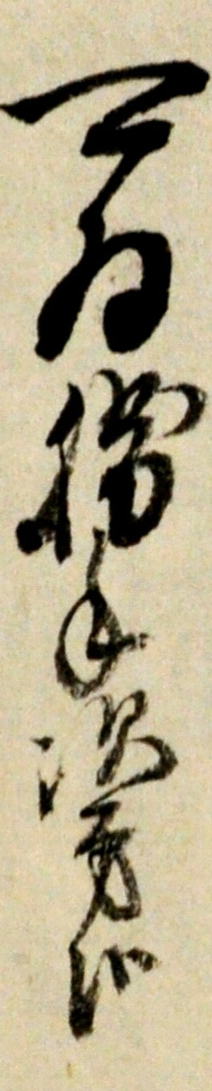可為勝手次第候

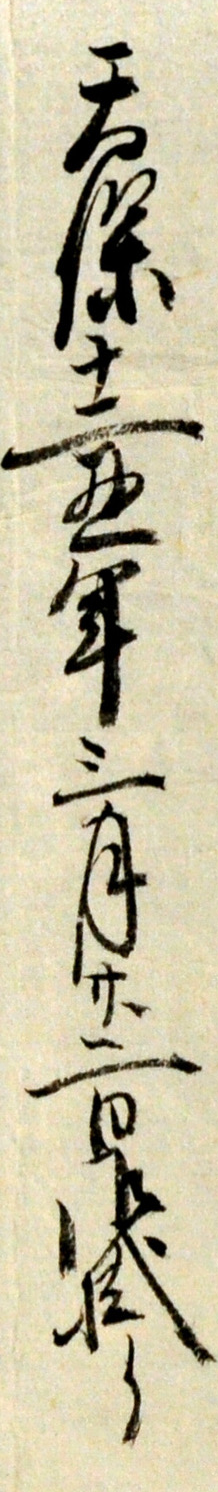天保十二丑年三月廿二日御掛り
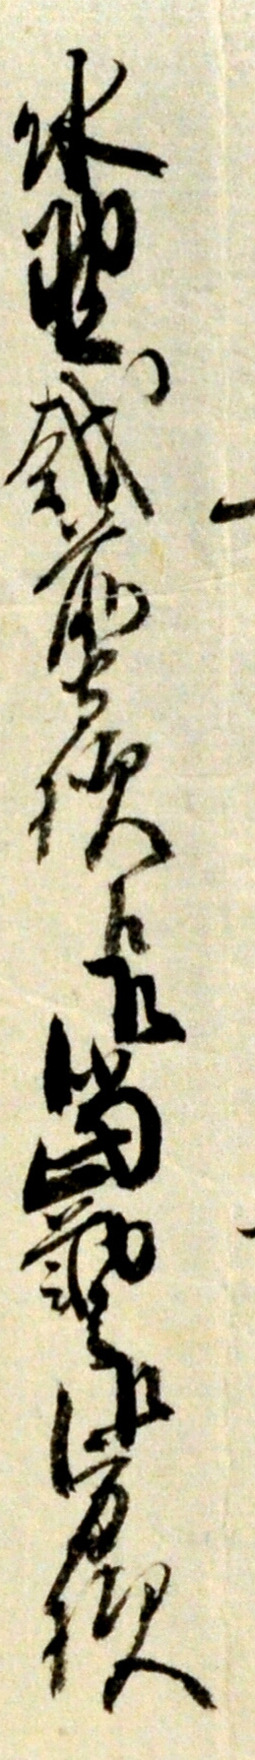水野越前守様江御当勤之御方様
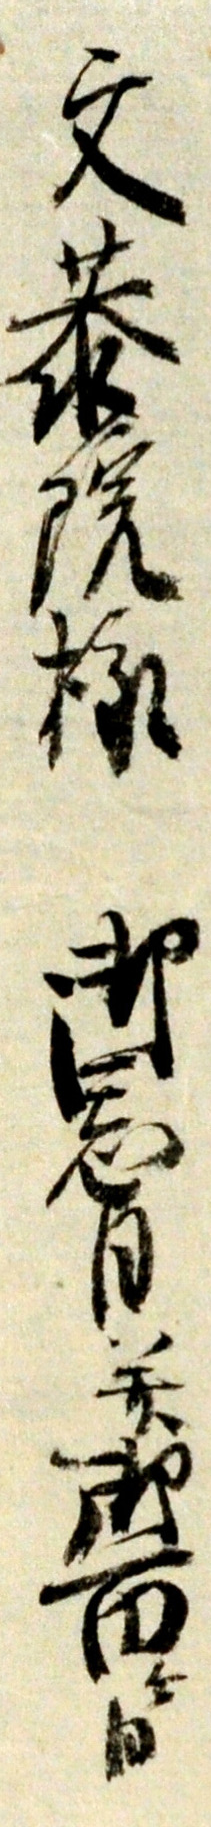文恭院様御忌日幷御百ケ日
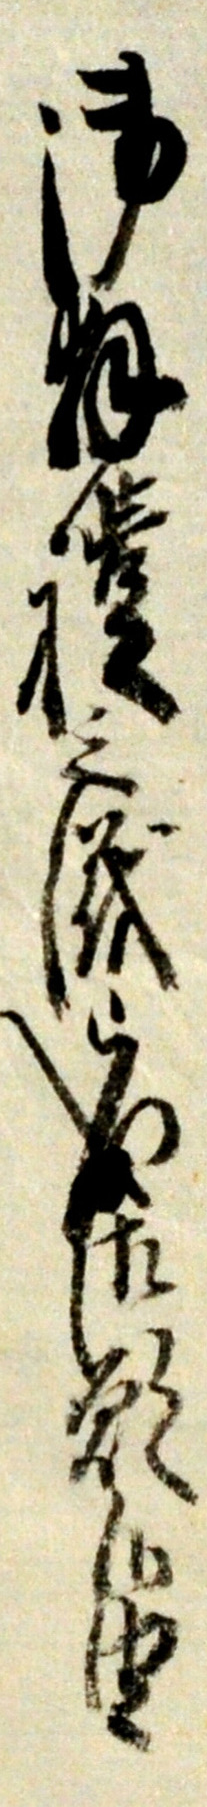御拝礼之儀被成御願候由
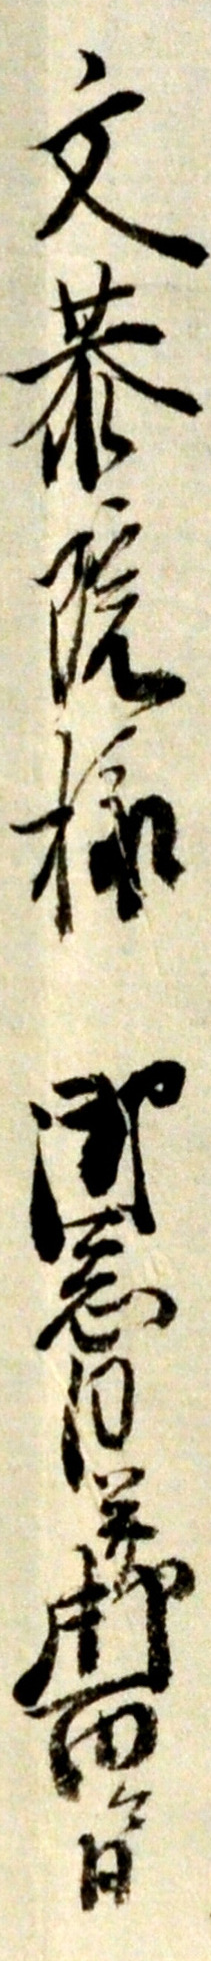文恭院様御忌日幷御百ケ日
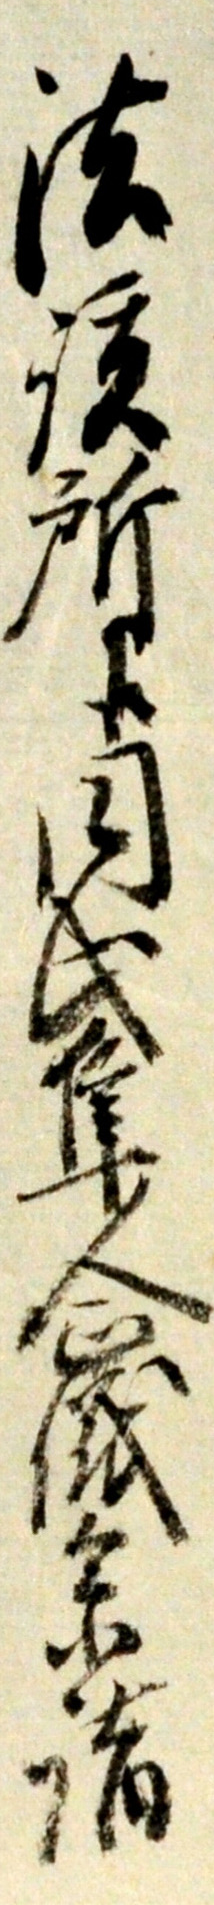法談所江同氏隼人正儀参詣
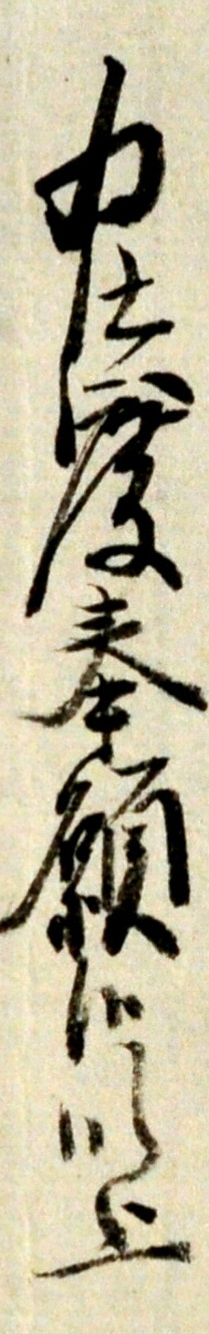為仕度奉願候以上
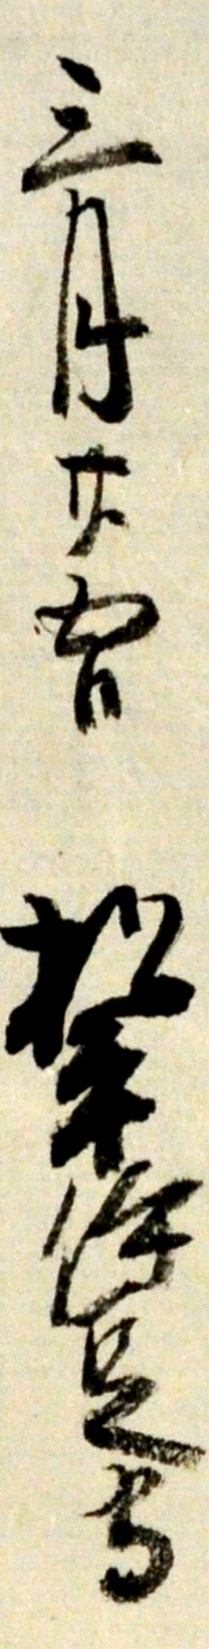三月廿五日松平伊豆守
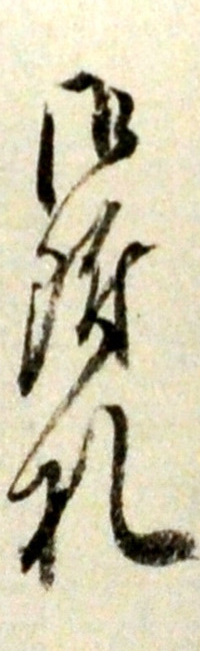御附札
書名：拝礼願
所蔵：伊那市立高遠町図書館・合同会社AMANE
